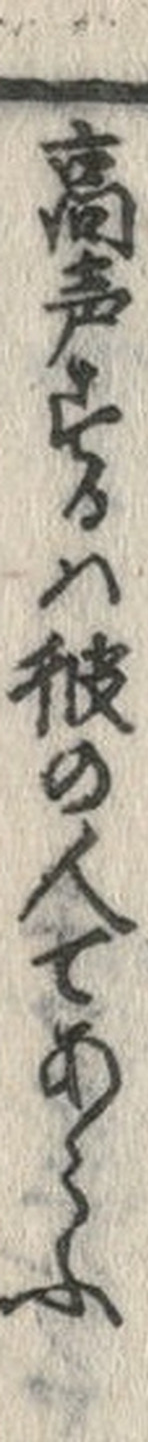高声するは彼の人てあらふ
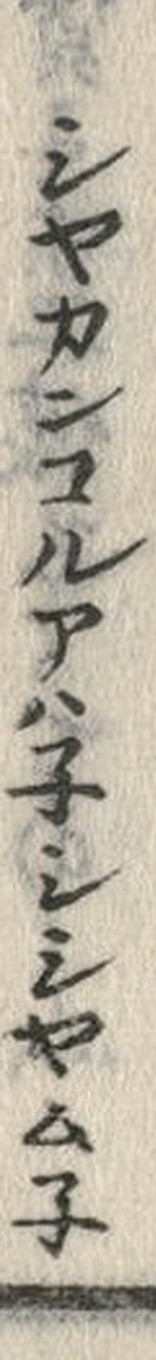シヤカンコルアハネシシヤムネ
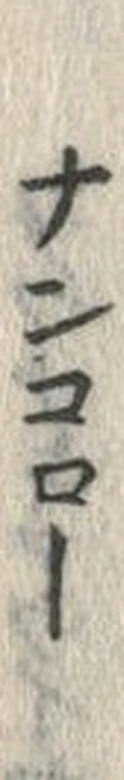ナンコロー
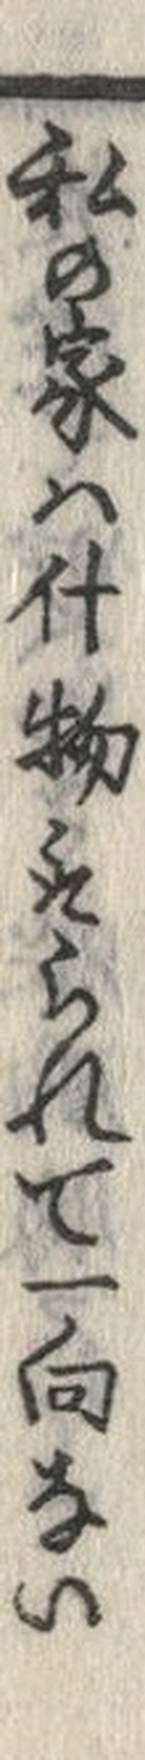私の家は什物取られて一向ない
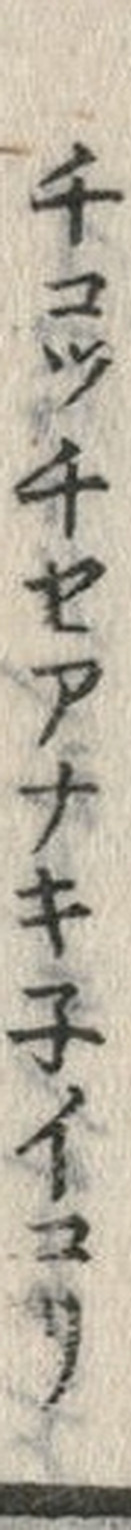チコツチセアナキネイコリ
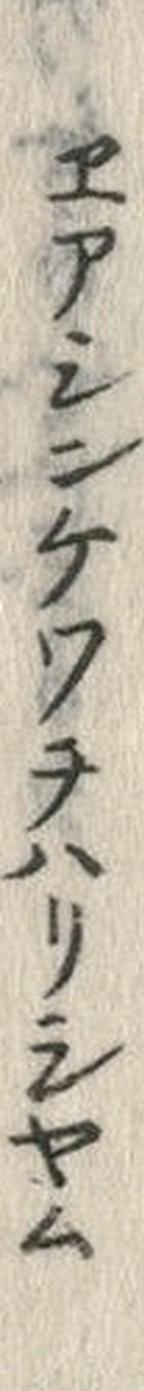ヱアシンケワチハリシヤム
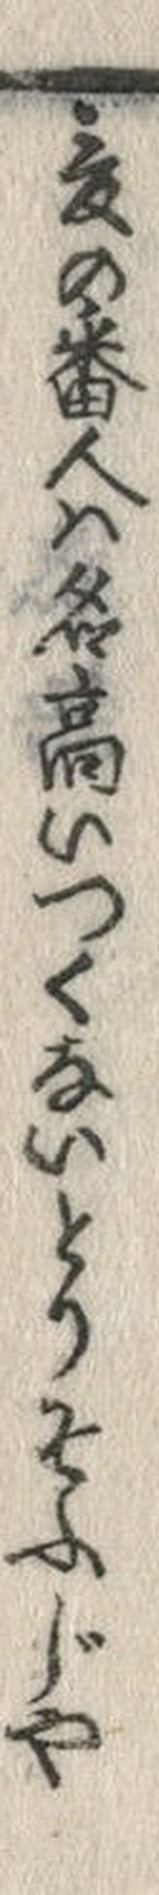爰の番人は名高いつくないとりそふじや

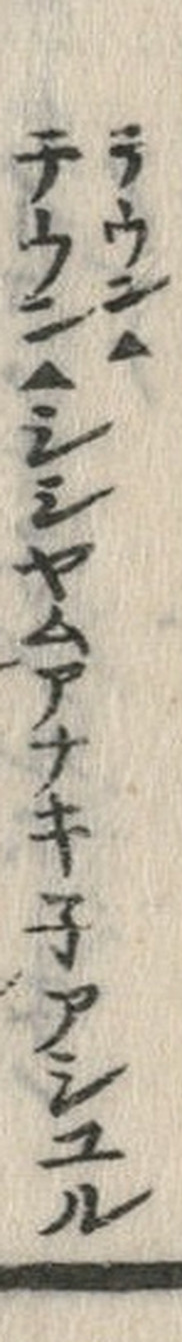テウン▲シシヤムアナキネアシユル
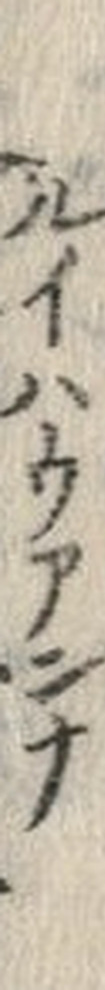ルイハウアンナ
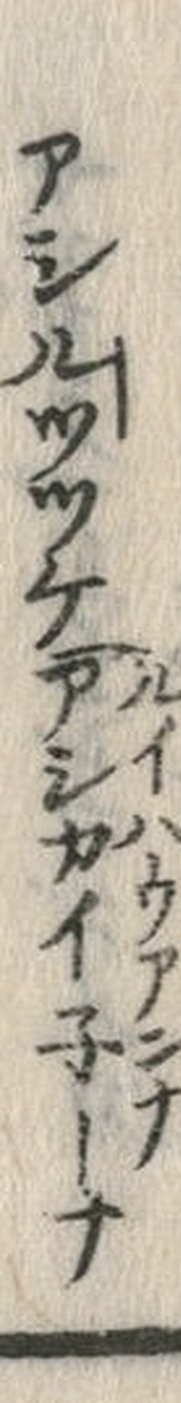アシルツツケアシルアシカイネーナ
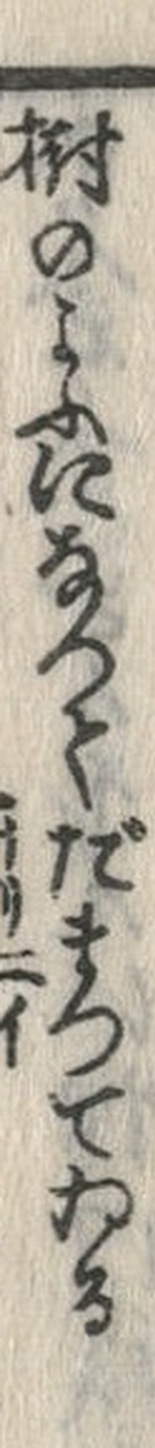樹のよふになつてだまつてゐる
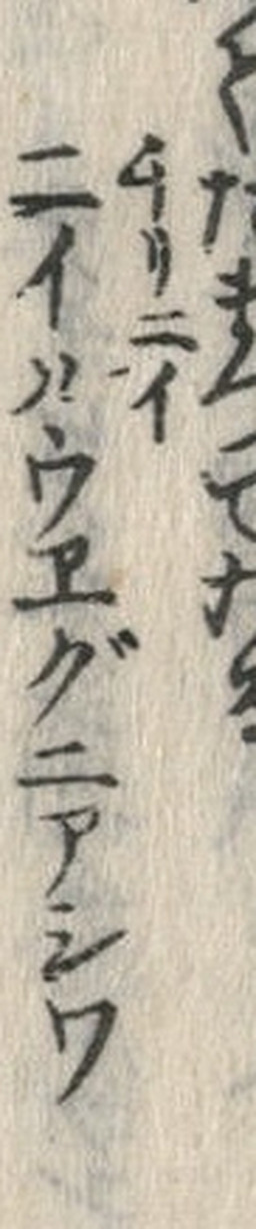ニイハウヱグニアシワ
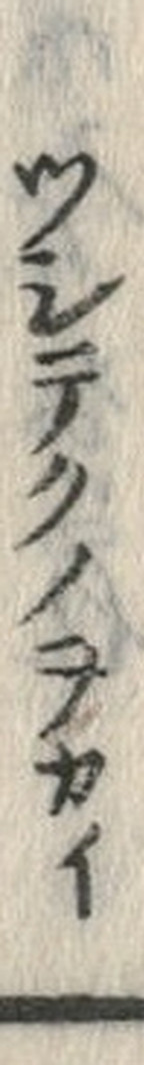ツシテクノヲカイ
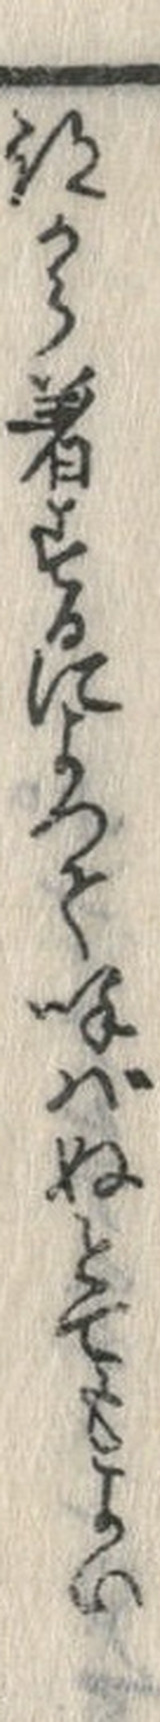跡から着するによつて呼バぬとてもよい
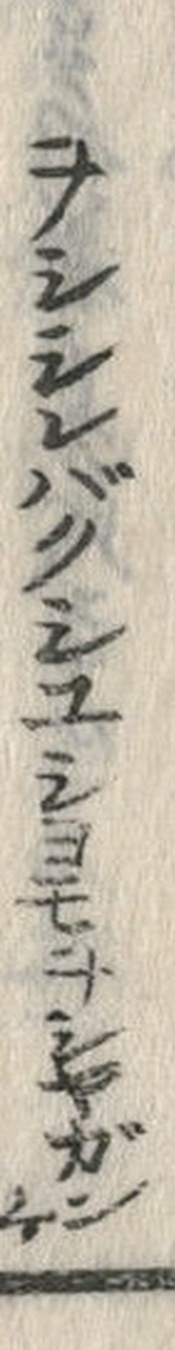ヲシシレバクシユシヨモチシヤガンケ
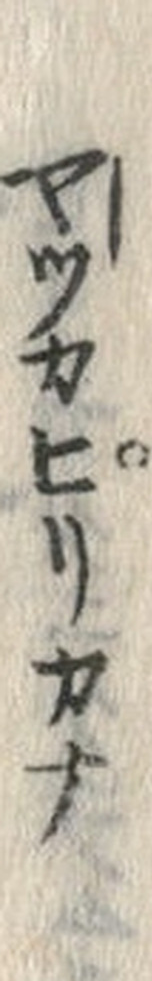ヤツカピリカナ
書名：蝦夷方言藻汐草　坤巻
